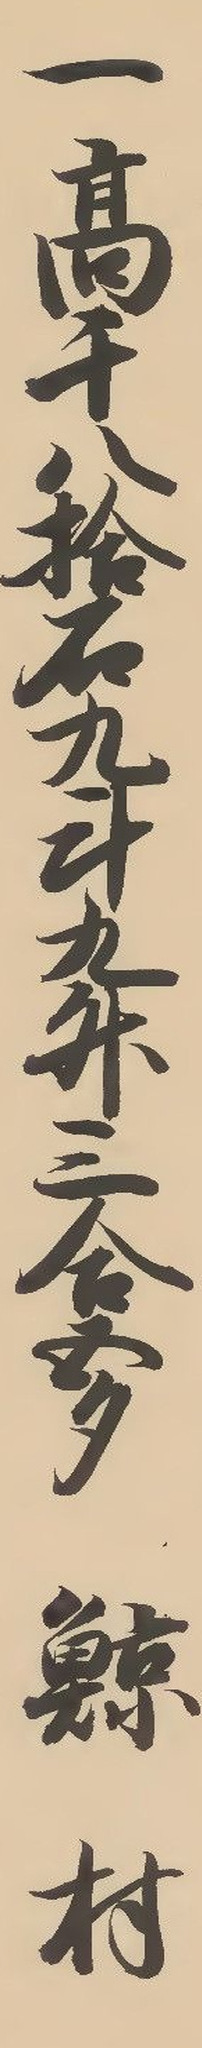一高千八拾石九斗九升三合五勺鯨村
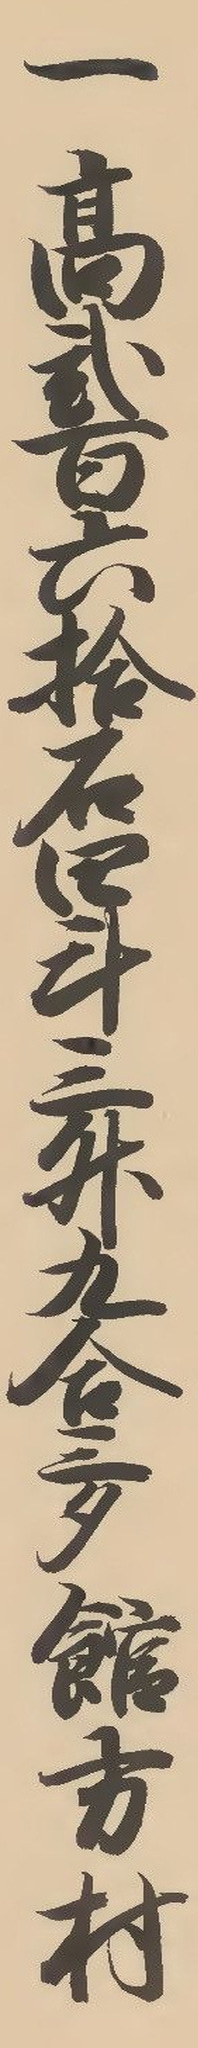一高弐百六拾石四斗三升九合三勺館方村
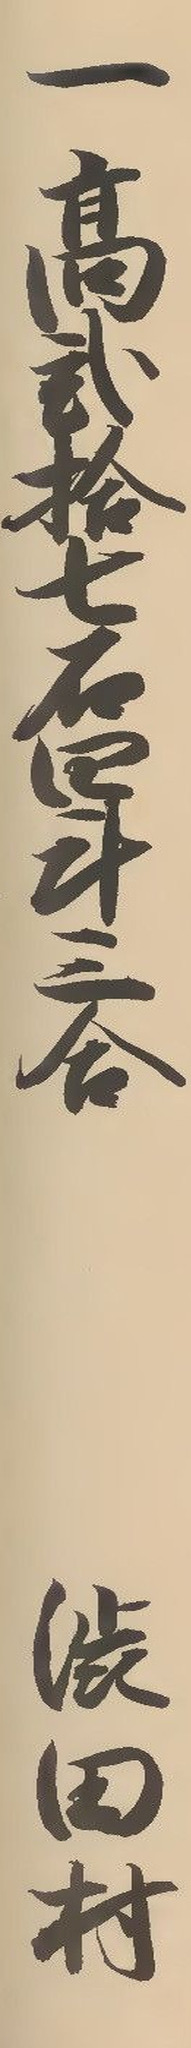一高弐拾七石四斗三合渋田村
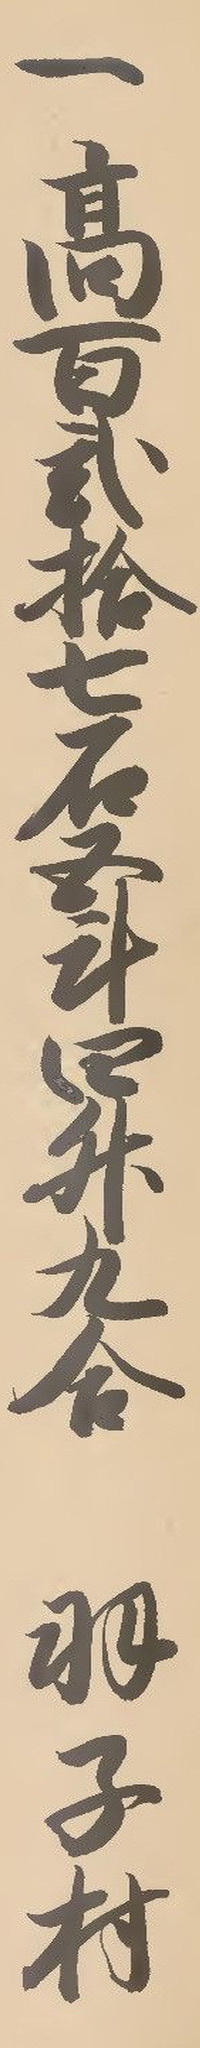一高百弐拾七石五斗四升九合羽子村
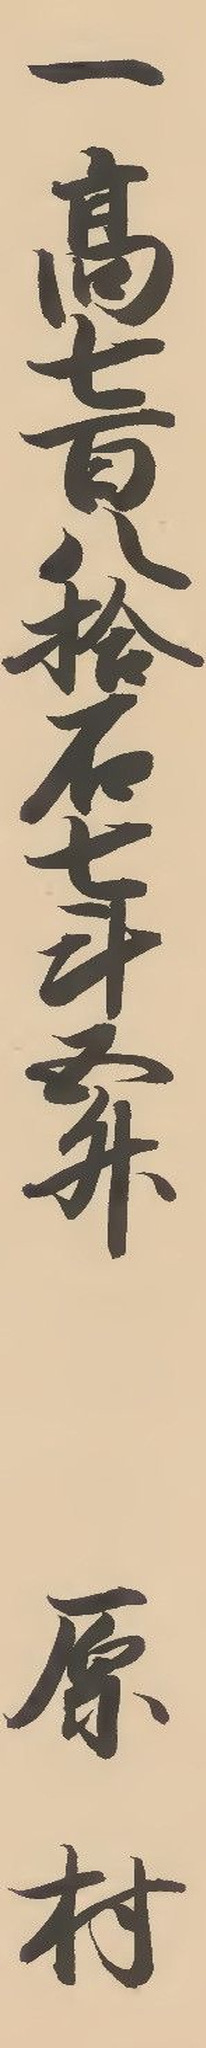一高七百八拾石七斗五升原村
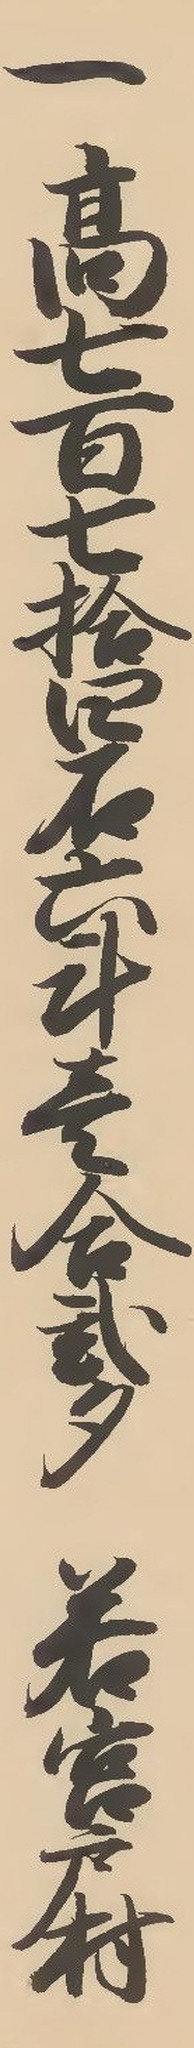一高七百七拾四石六斗壱合弐勺若宮戸村
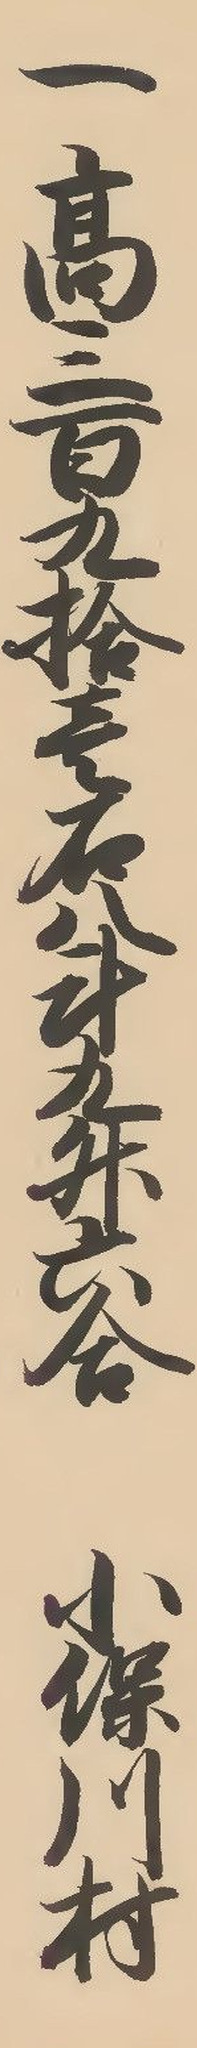一高三百九拾壱石八斗九升六合小保川村

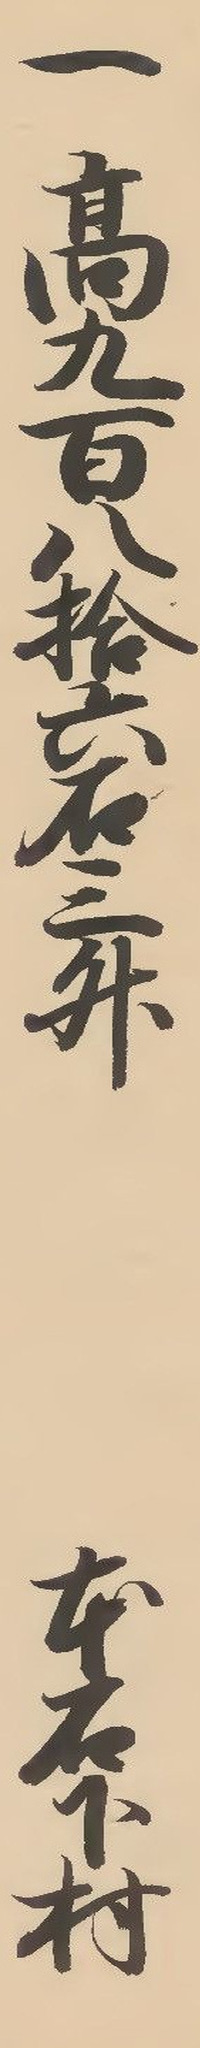一高九百八拾六石三升本石下村
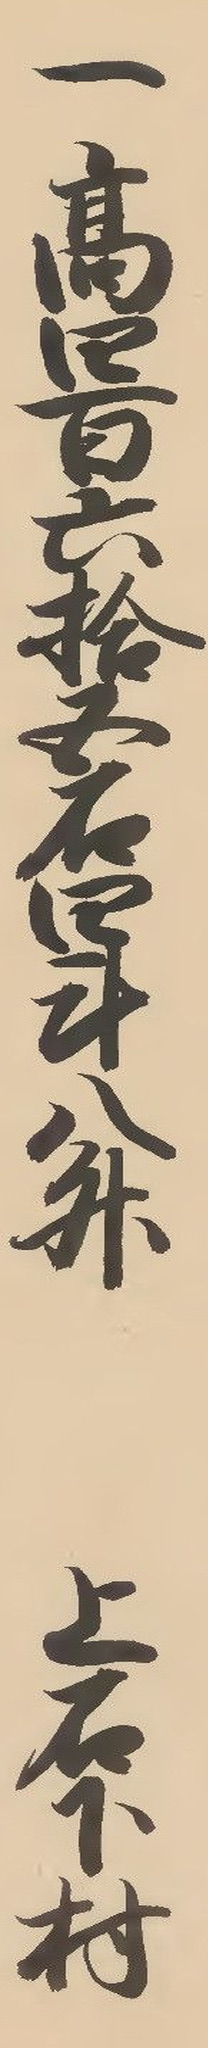一高四百六拾五石四斗八升上石下村
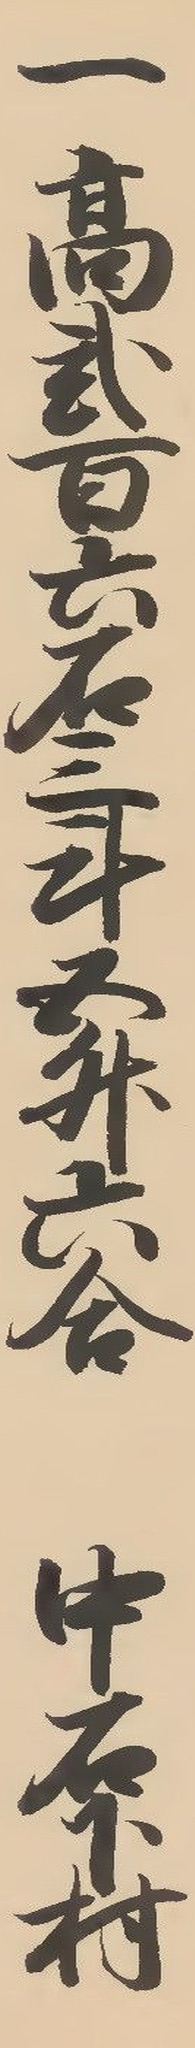一高弐百六石三斗五升六合中石下村
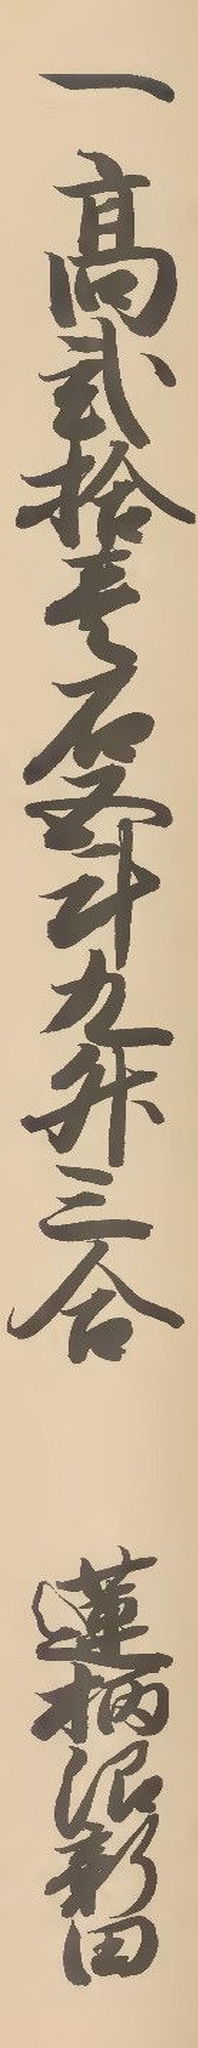一高弐拾壱五斗九升三合蓮柄沼新田
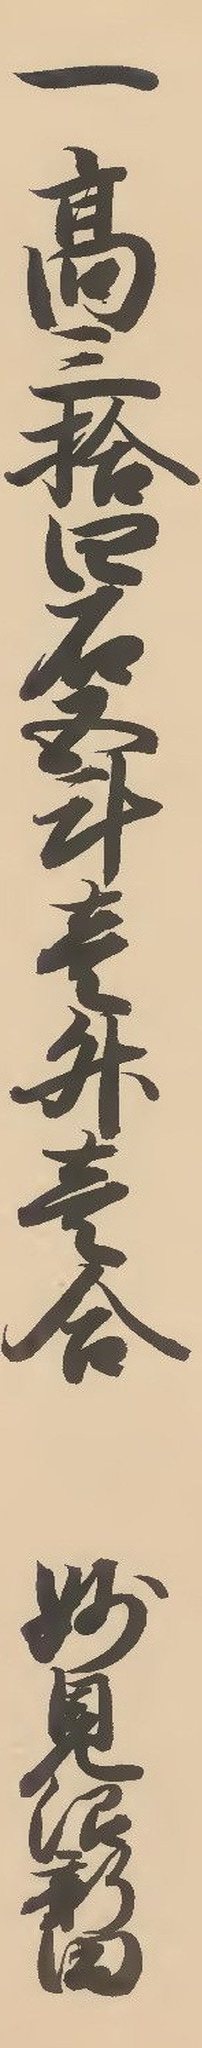一高三拾四石五斗壱升壱合妙見沼新田
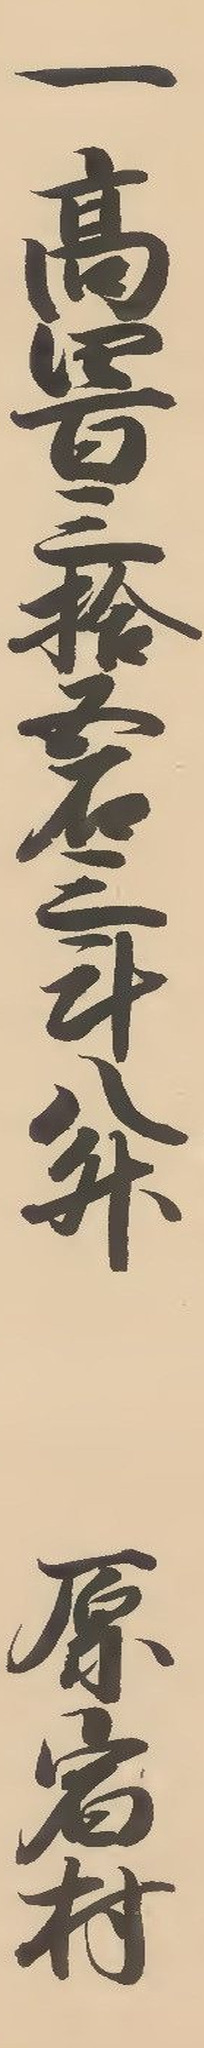一高四百三拾五石三斗八升原宿村
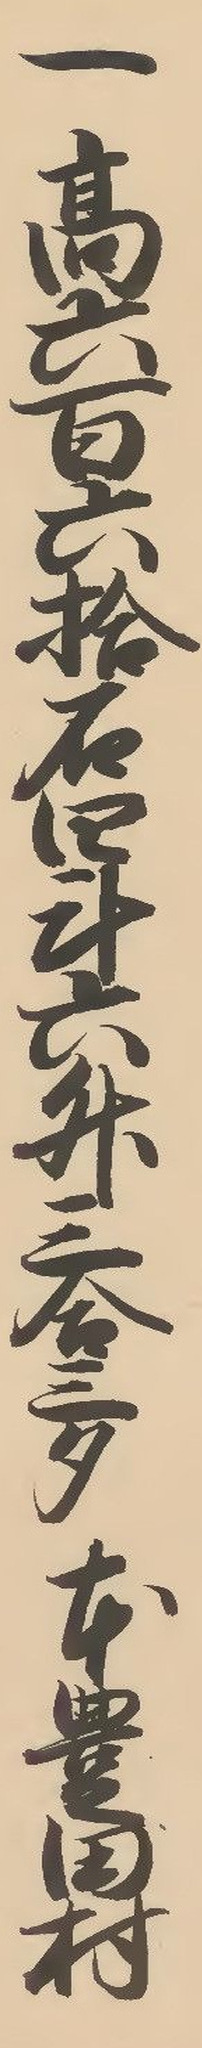一高六百六拾石四斗六升三合三勺本豊田村

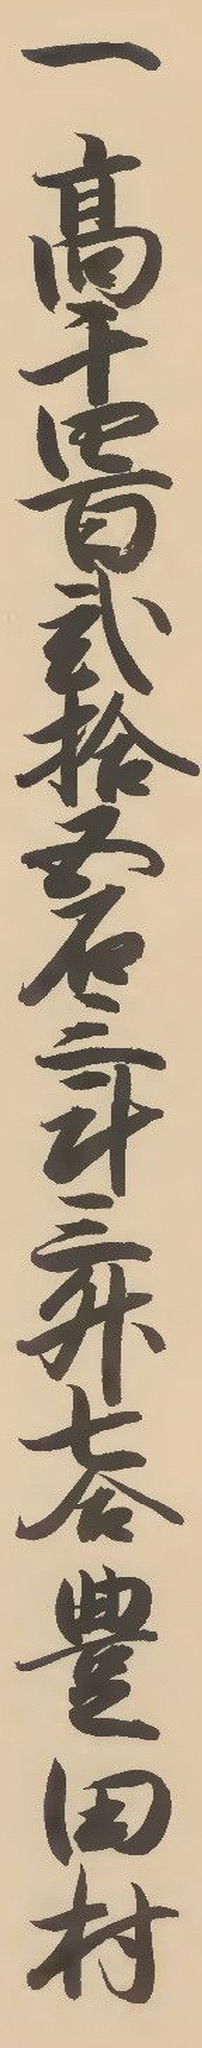一高千四百弐拾五石三斗三升七合豊田村
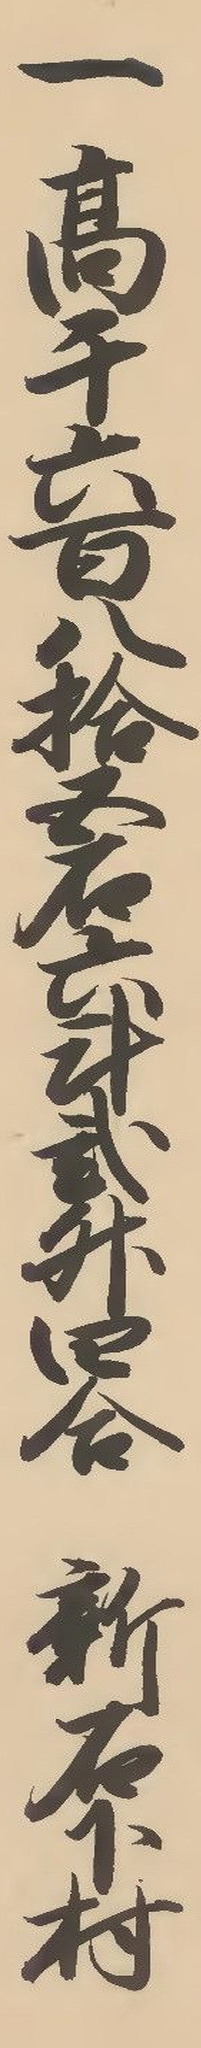一高千六百八拾五石六斗弐升四合新石下村
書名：下総国郷帳
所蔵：国立公文書館 National Archives of Japan
